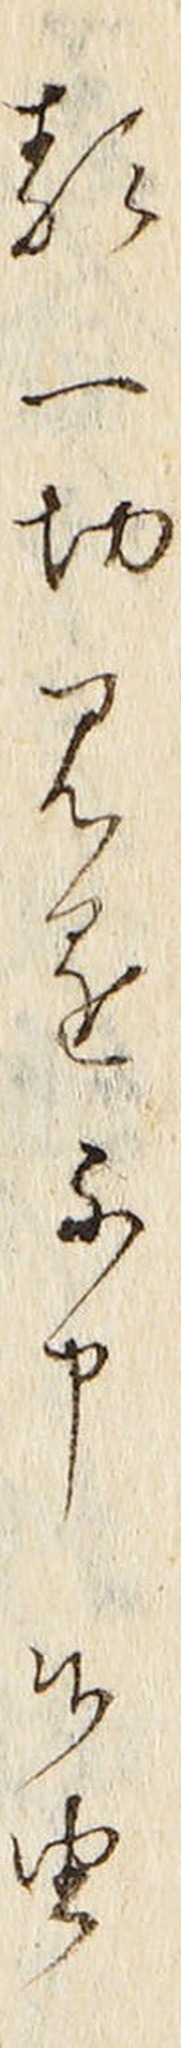類一切見懸不申候由
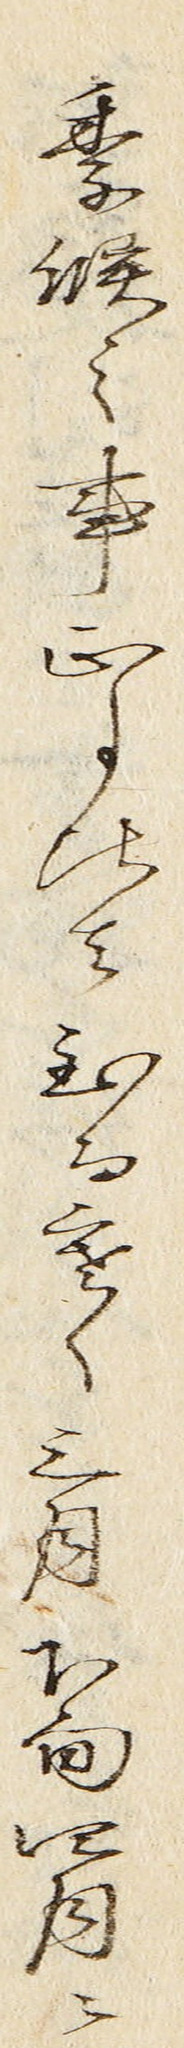一季候之事正月頃は至而寒く三月下旬四月に
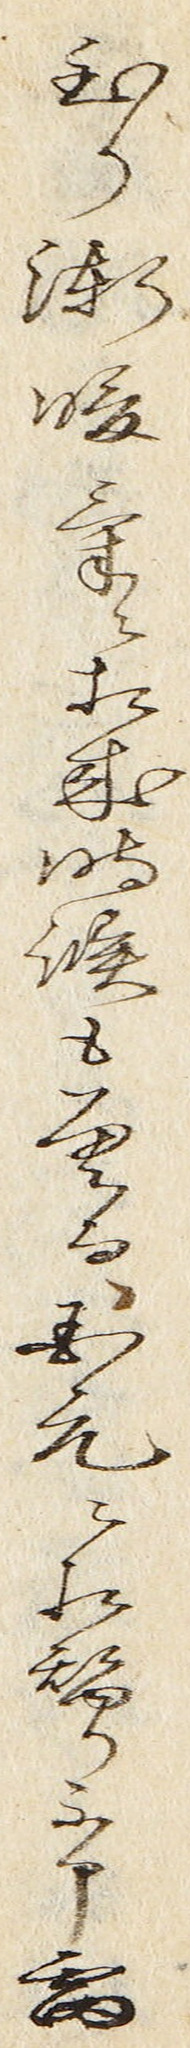至り漸暖気に相成時候も而国元に相替り不申雷
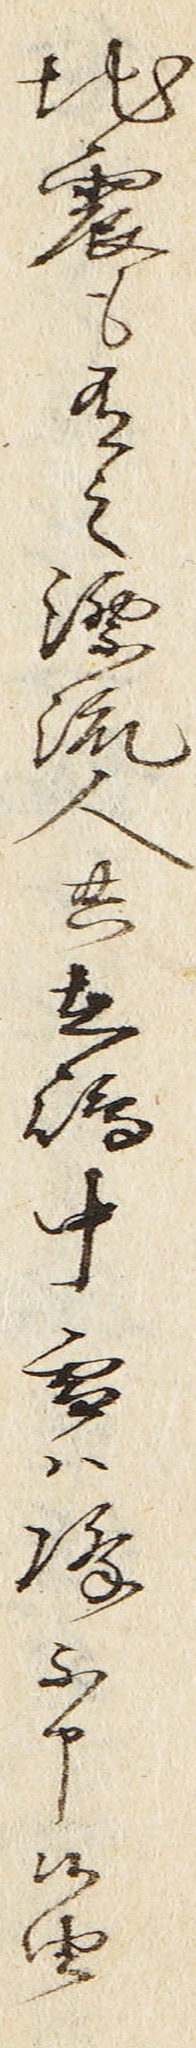地震も有之漂流人共在嶋中雪は降不申候由
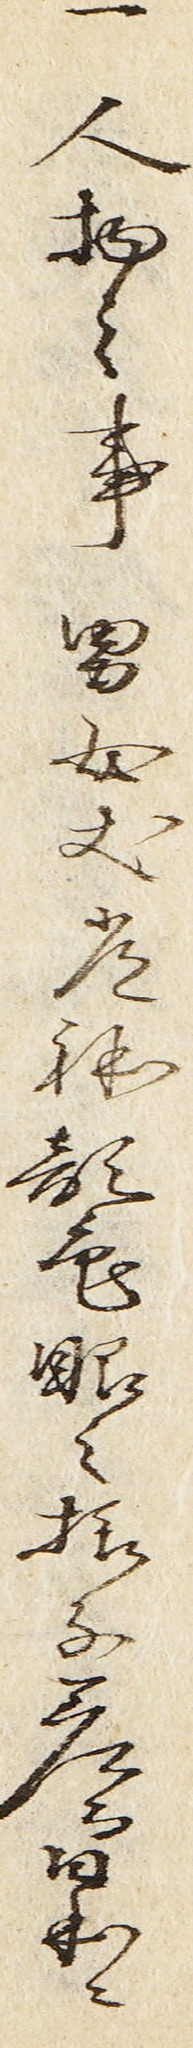一人物之事男女丈常躰顔色眼之様子差而日本と
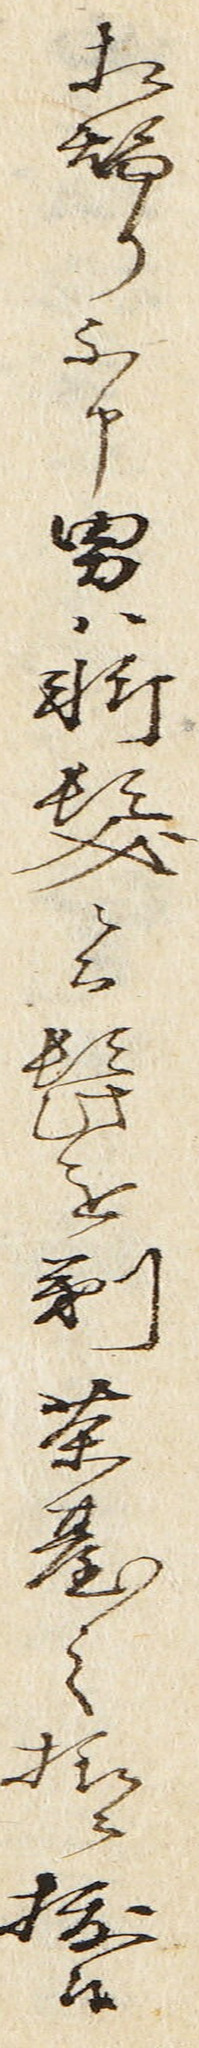相替り不申男はざん斬髪に而髭を剃茶台之様に抜候
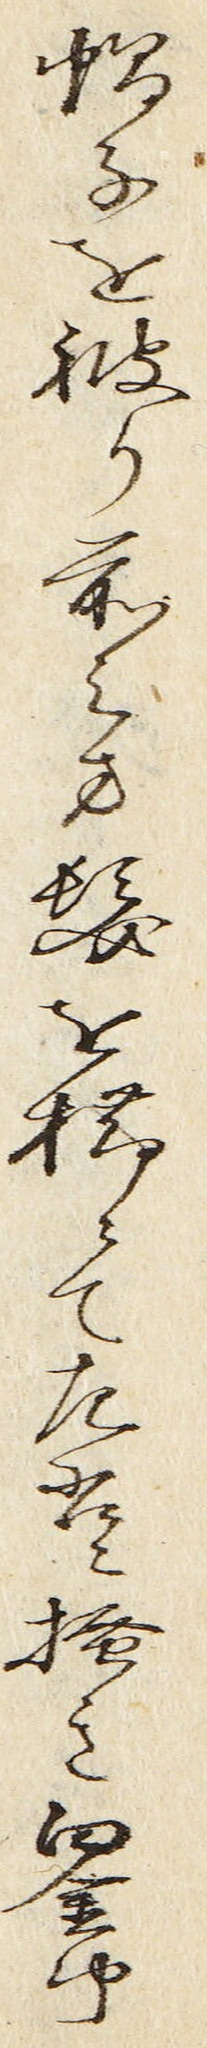帽子を被り前之方髪を櫛にて左右に搔き白金巾
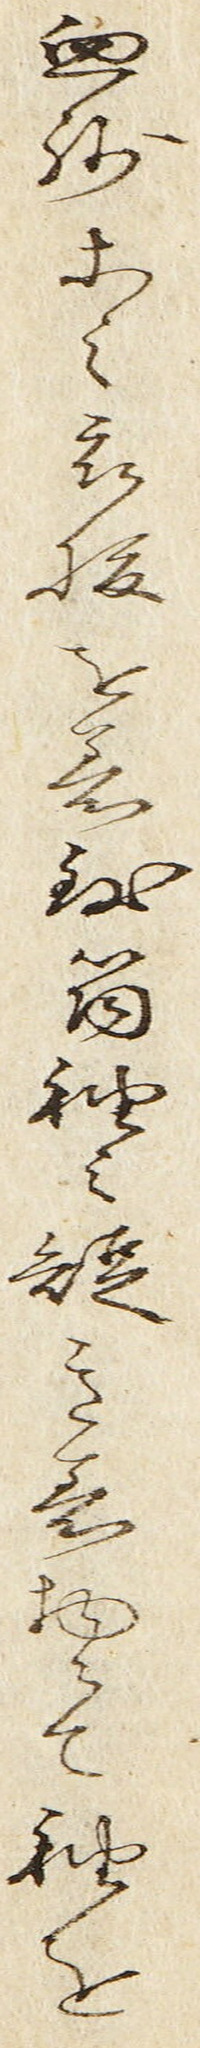皿紗等之衣服を着致筒袖之短き着物にて袖を
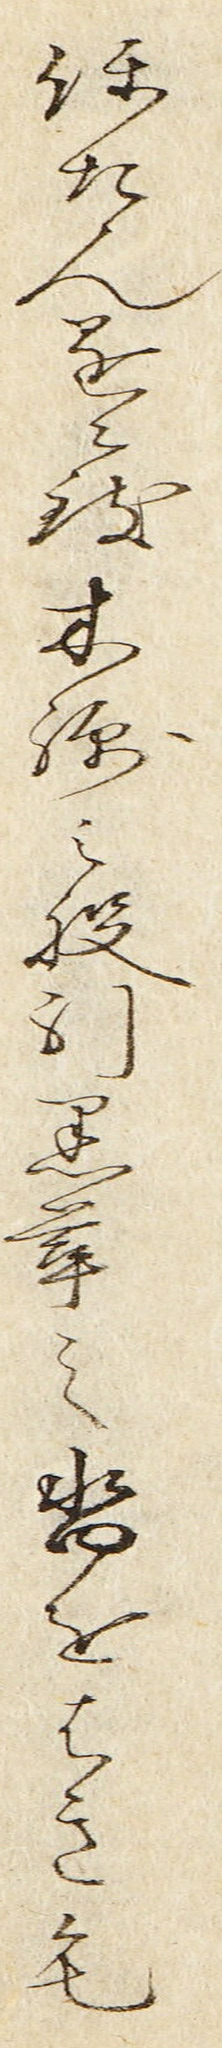ほたん懸に致木綿之股引黒革之沓をはき毛

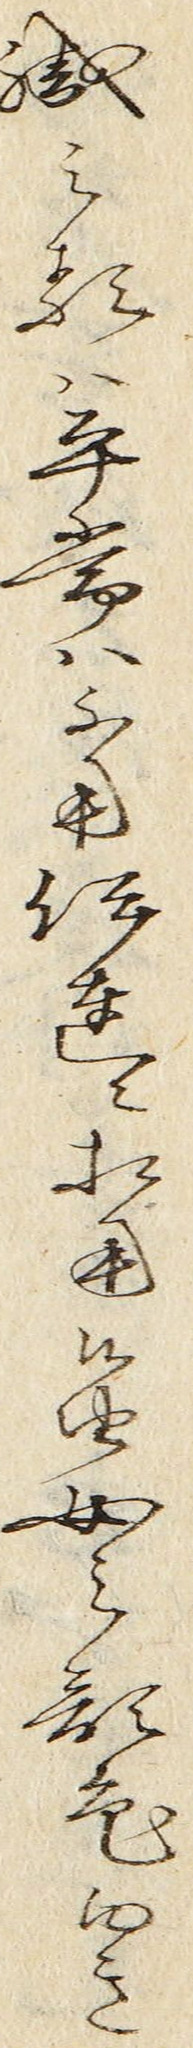織之類は平常は不用伊達に相用候由女之顔色白き
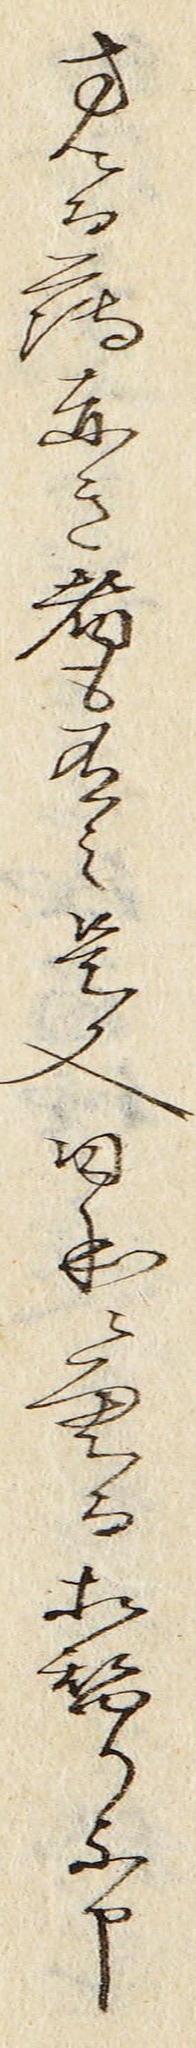方に而落赤き者も有之是又日本に差而相替り不申
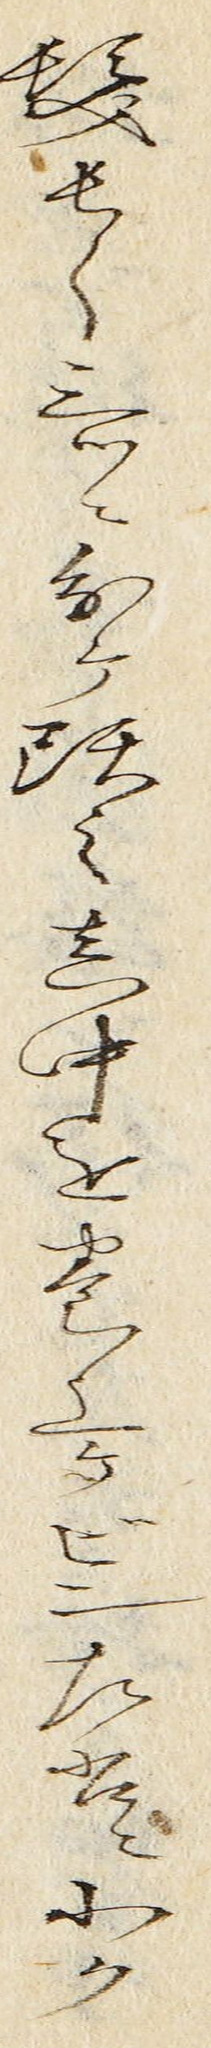髪長く三ッに分け頭之真中を巻上けビン左右に小く
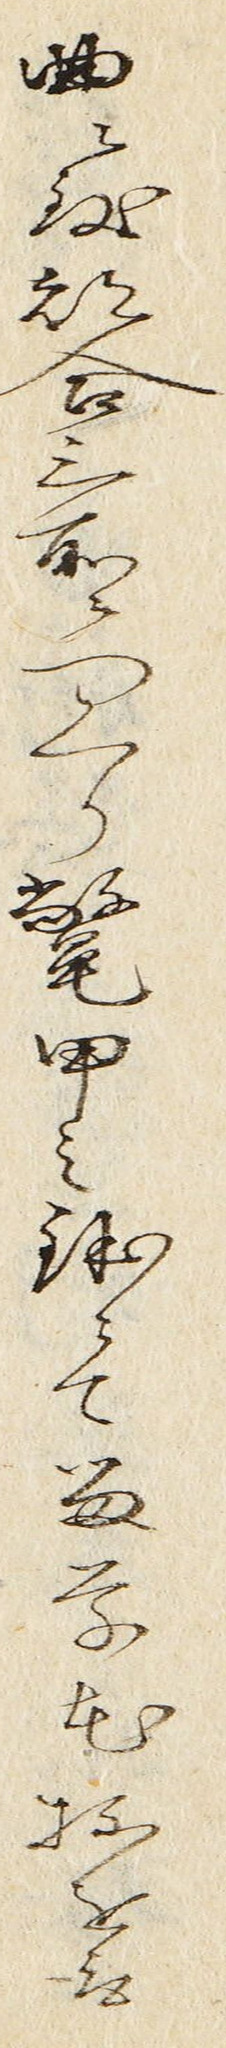曲に致都合三所につくりて鼈甲之鉢にて留草花等を取
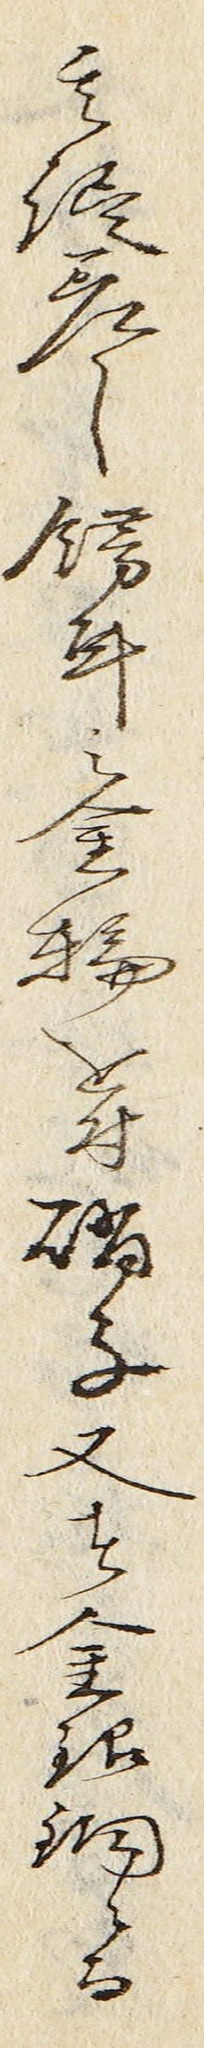其侭差し錺耳之金輪を付硝子又は金銀銅に而
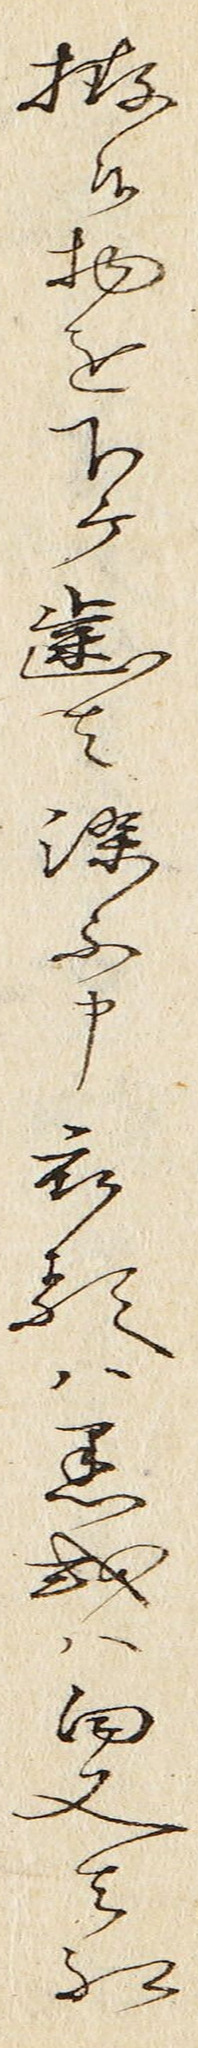拵候物を下け歯は染不申衣類は黒或は白又は紅
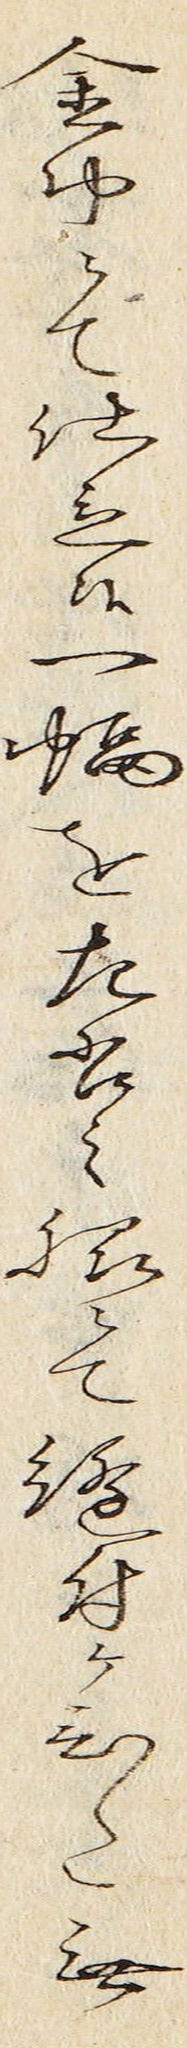金巾にて仕立候一幅を左右之脇にて縫付ヶひた無
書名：土佐中浜万次郎漂流記
